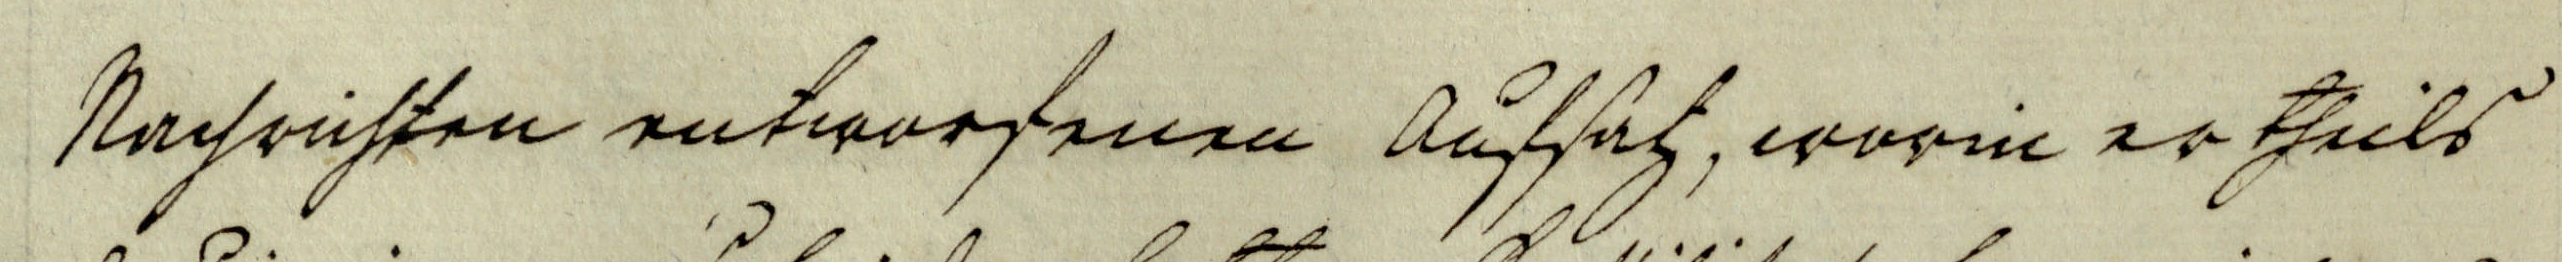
Nachrichten entworfenen Aufsatz, worin er theils
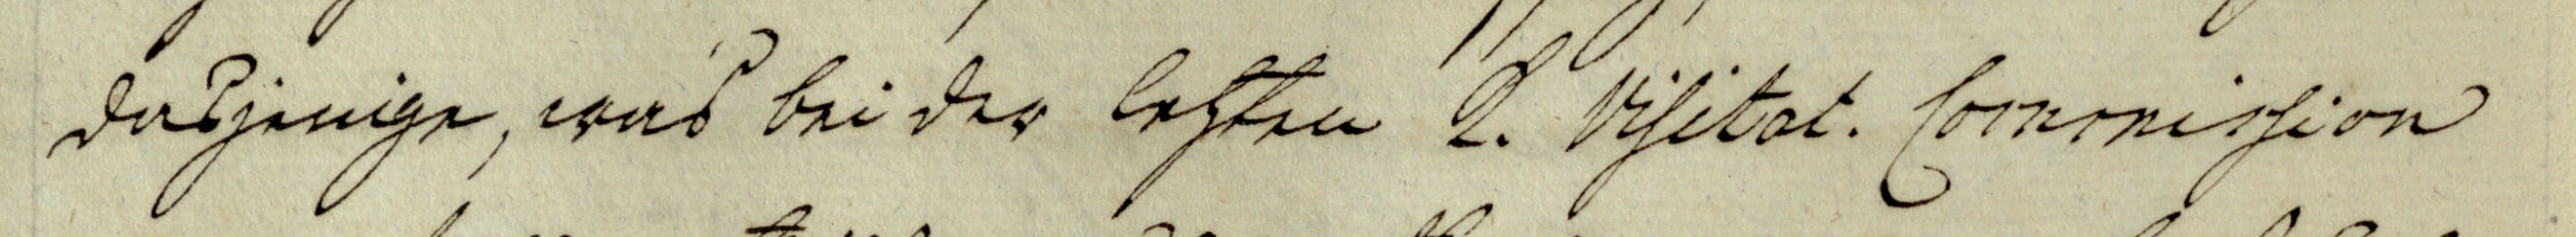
dasjenige, was bei der letzten K. Visitat. Commission
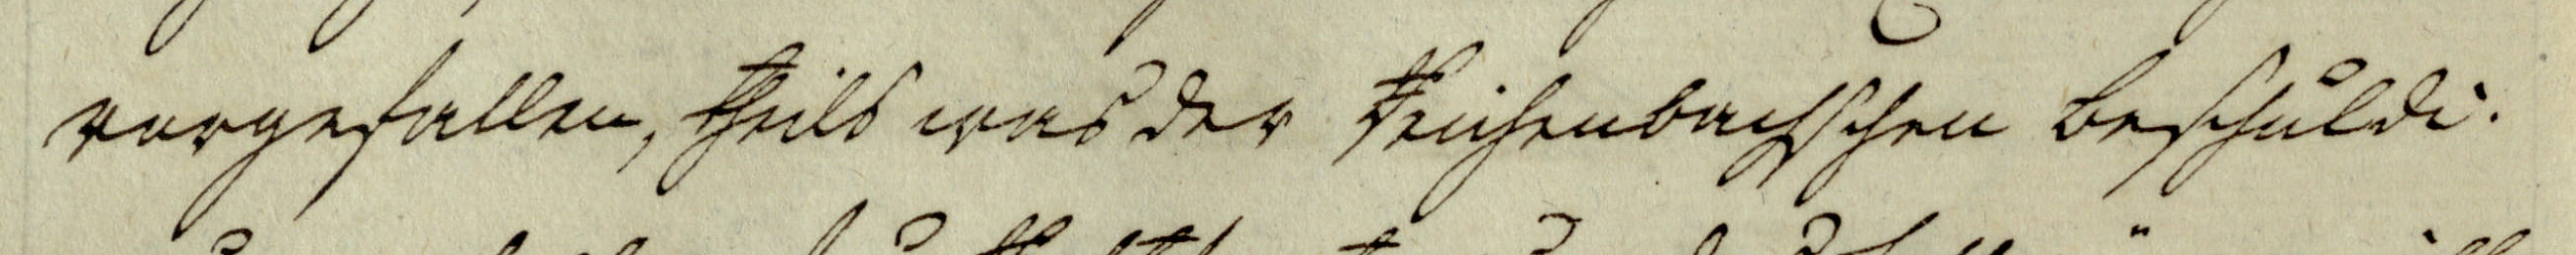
vorgefallen, theils was der Reichenbachschen Beschuldi¬
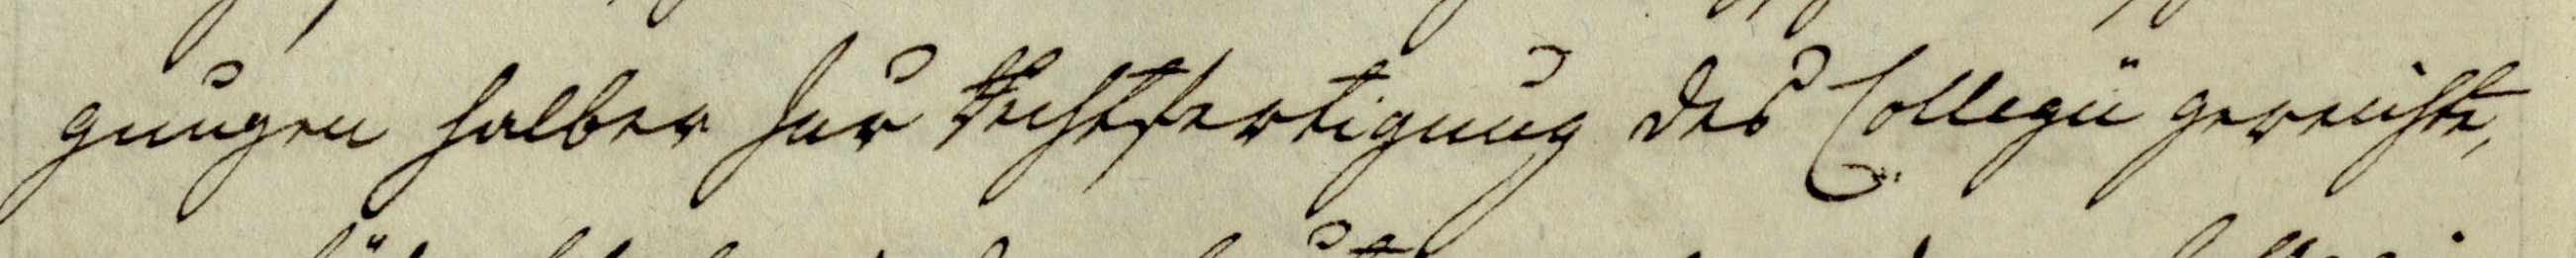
gungen halber zur Rechtfertigung des Collegii gereichte,
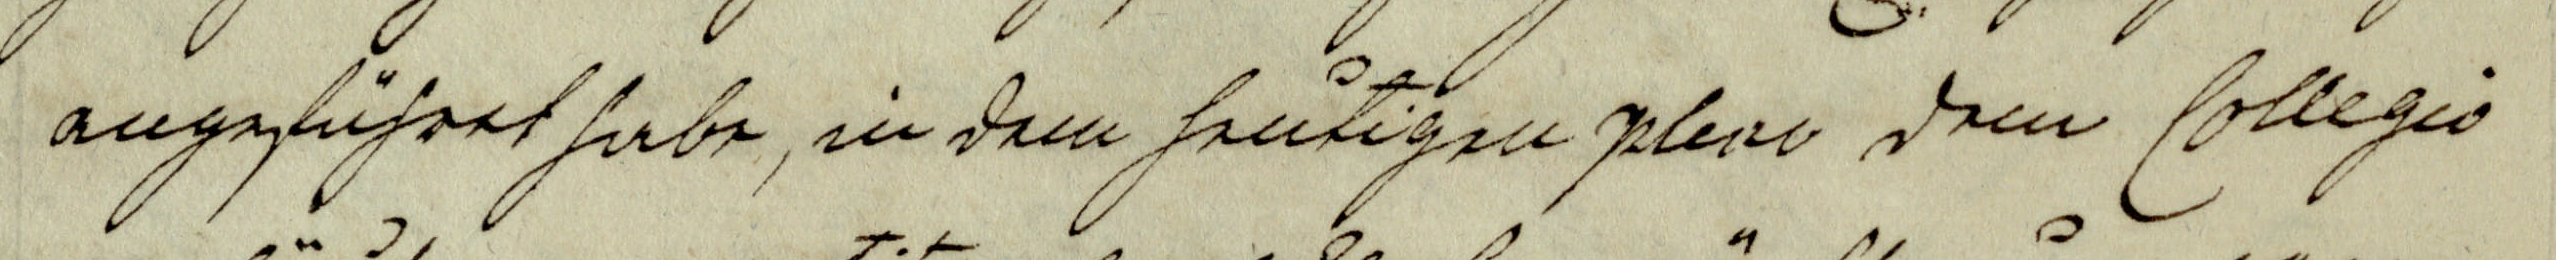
angeführet habe, in dem heutigen pleno dem Collegio
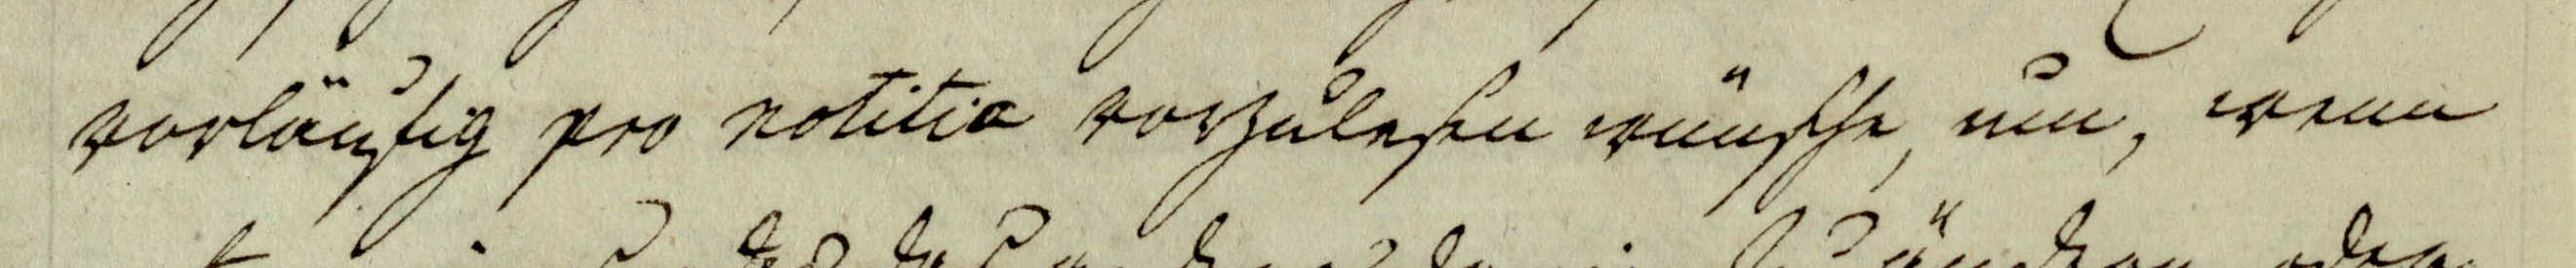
vorläufig per notitia vorzulesen wünsche, um, wenn
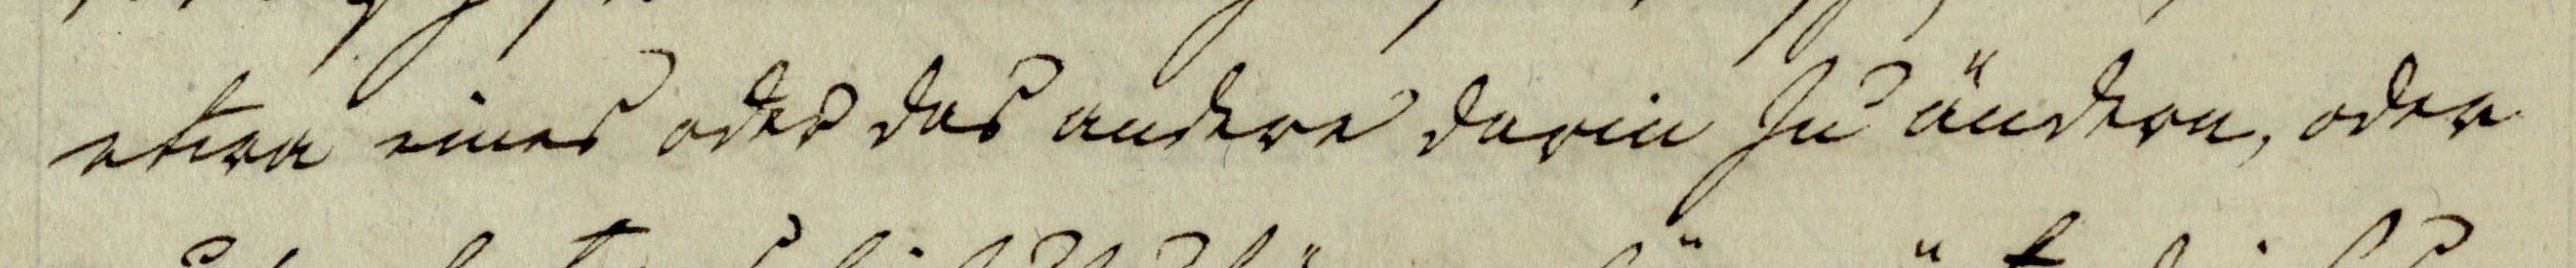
etwa eines des das andere darin zu ändern, oder
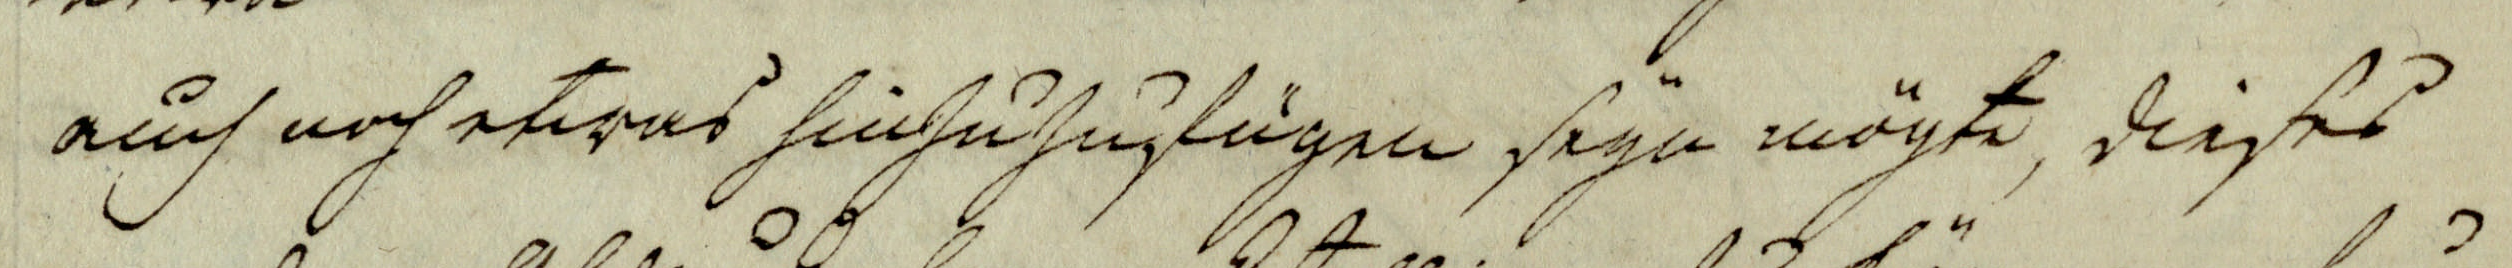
auch noch etwas hinzuzufigen seÿn mögte, dieses
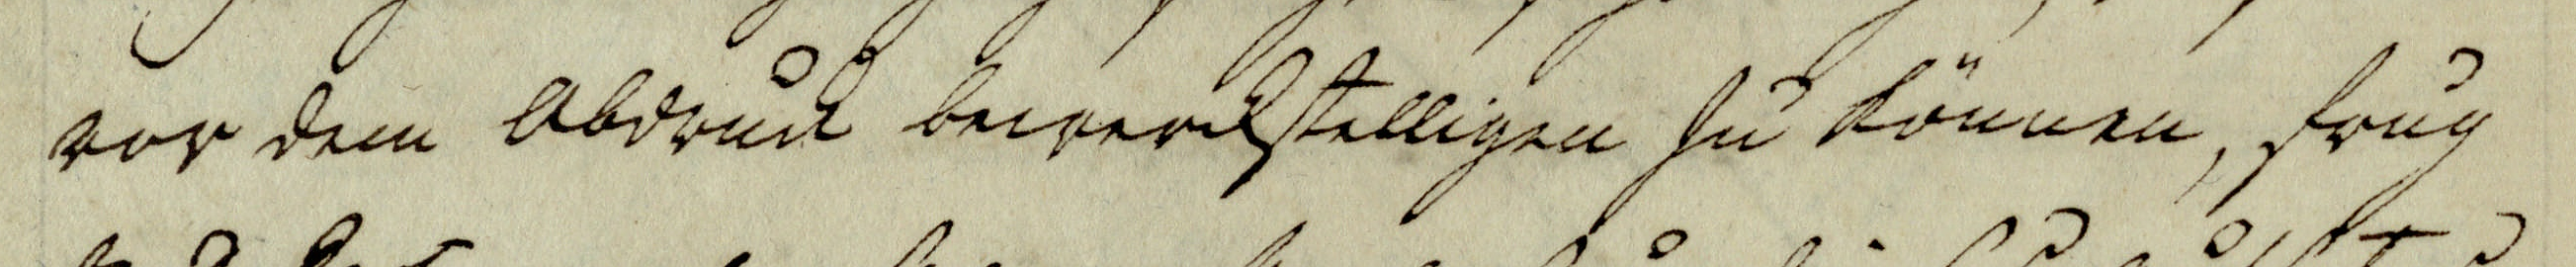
vor dem Abdruck bewerckstelligen zu können, frug
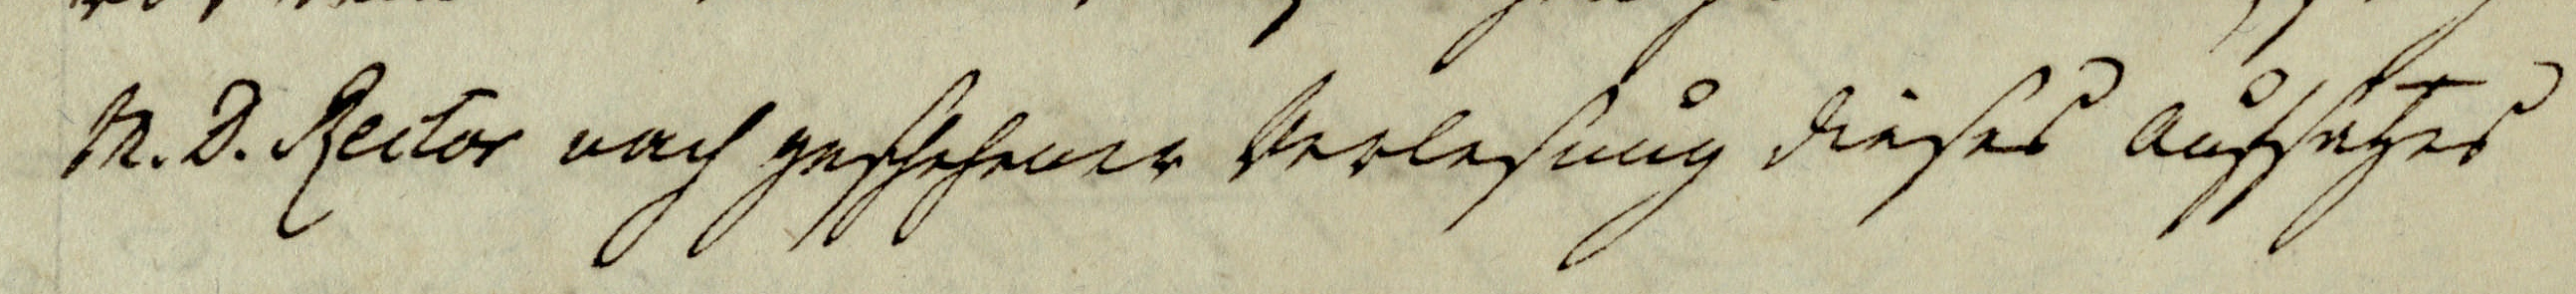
M. D. Rector nach geschehener Vorlesung dieses Aufsatzes
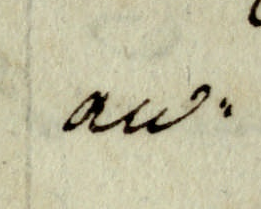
an:
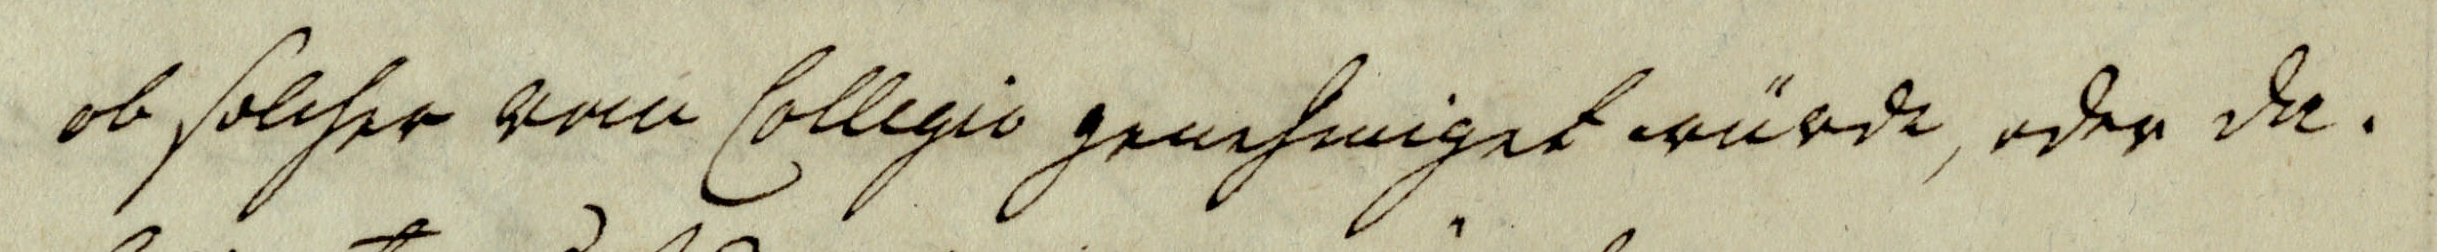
ob solcher vom Collegio genehmiget würde, der da¬
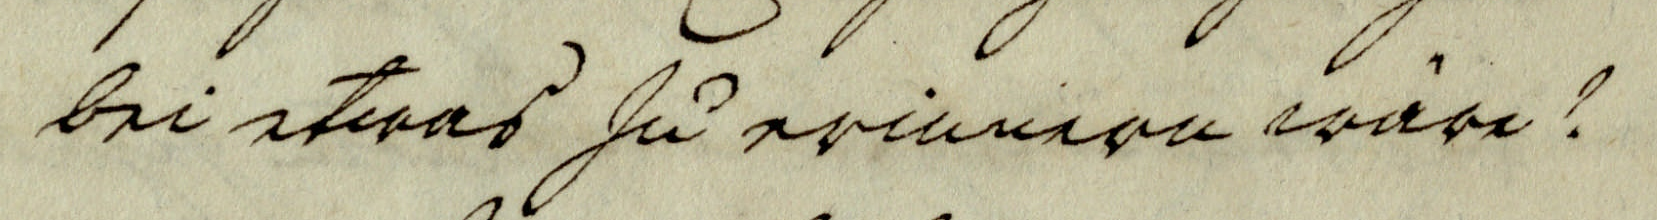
bei etwas zu erinnern wäre?
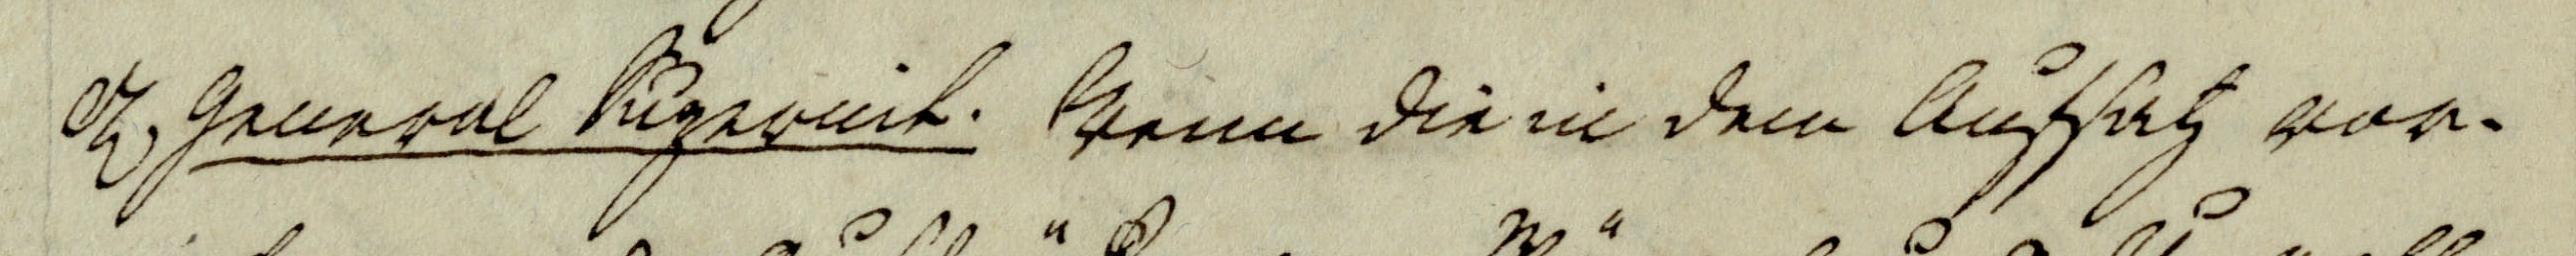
dh. General Superint. Wenn die in dem Aufsatz vor¬
